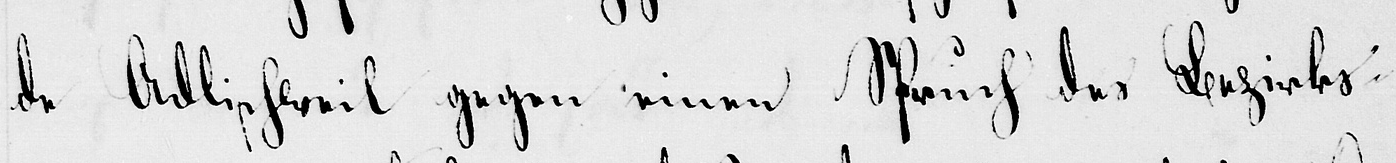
de Adlischweil gegen einen Spruch des Bezirks¬
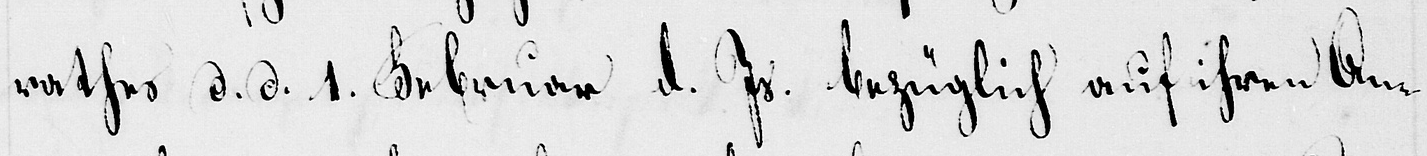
rathes d. d. 1. Februar d. Js. bezüglich auf ihren An¬
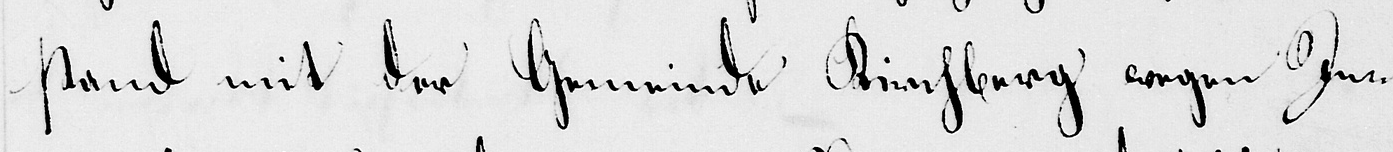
stand mit der Gemeinde Kirchberg wegen In¬
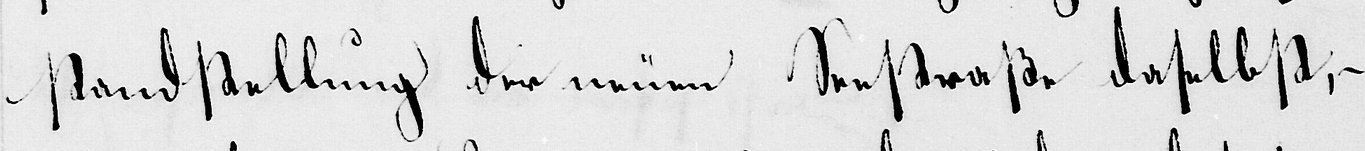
standstellung der neuen Seestraße daselbst, –
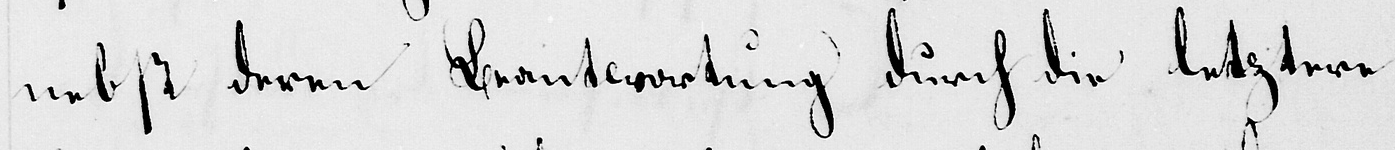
nebst deren Beantwortung durch die letztere
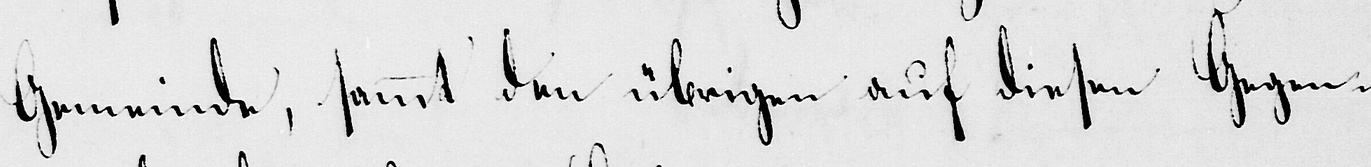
Gemeinde, sammt den übrigen auf diesen Gegen¬
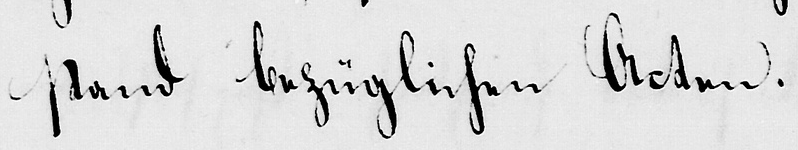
stand bezüglichen Acten.
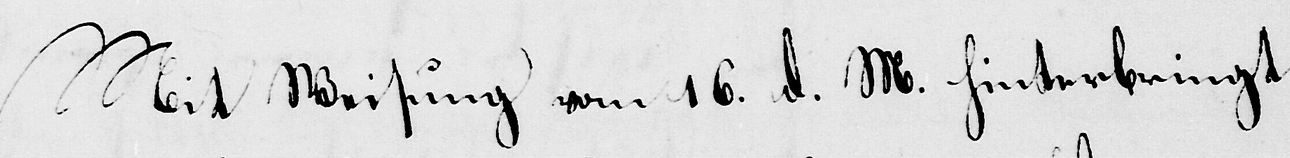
Mit Weisung vom 16. d. M. hinterbringt
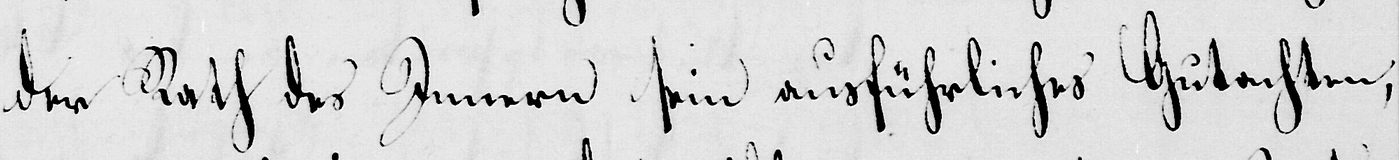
der Rath des Innern sein ausführliches Gutachten,
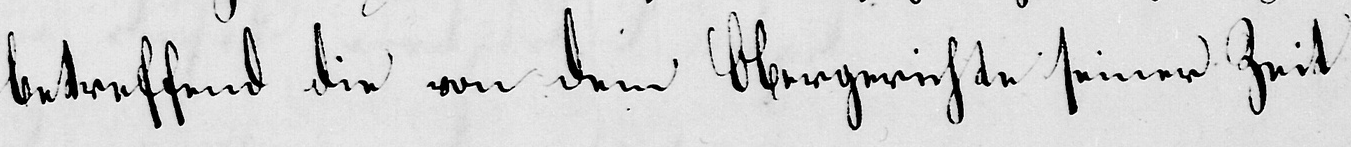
betreffend die von dem Obergerichte seiner Zeit
